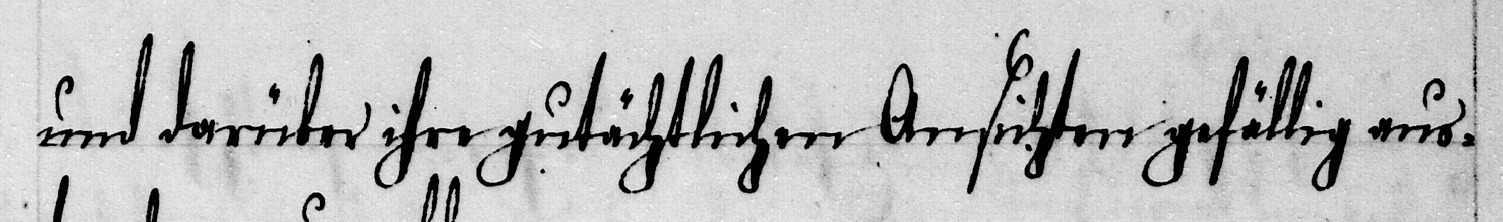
und darüber ihre gutächtlichen Ansichten gefällig aus¬
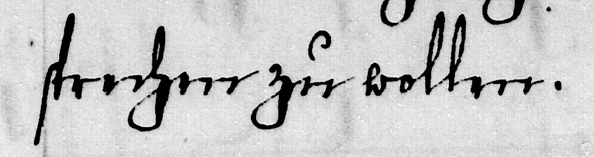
sprechen zu wollen.
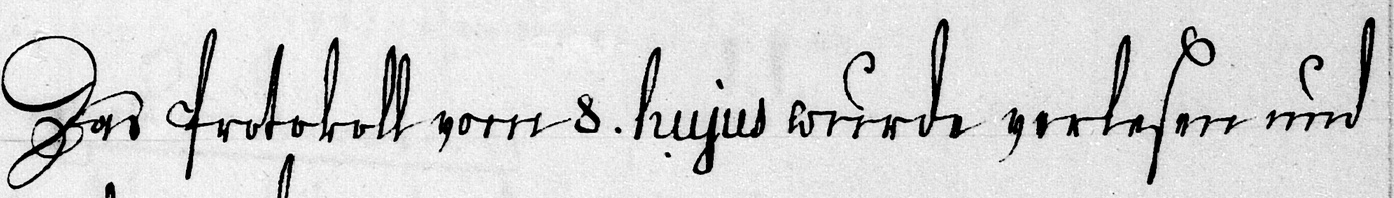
Das Protokoll vom 8. hujus wurde verlesen und
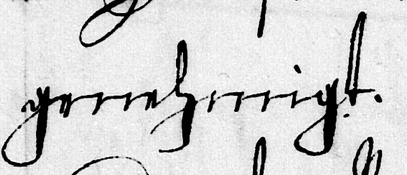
genehmigt.
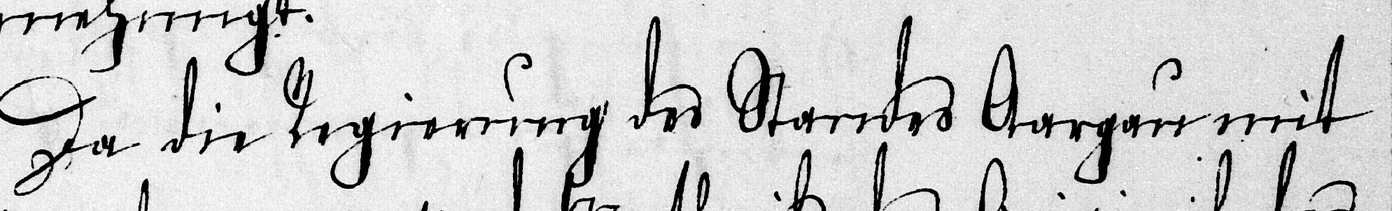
Da die Regierung des Standes Aargau mit
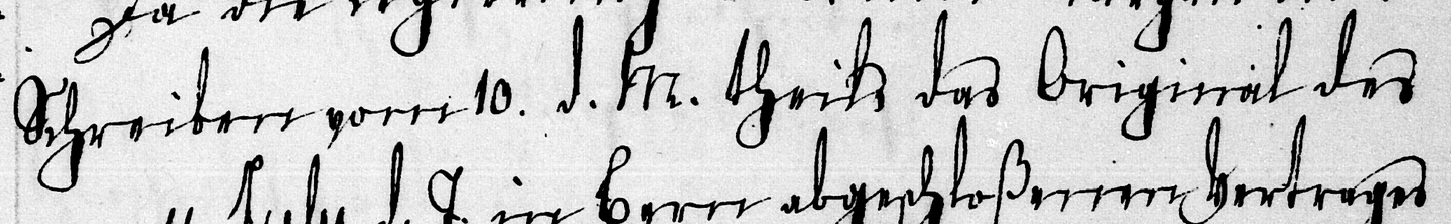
Schreiben vom 10. d. M. theils das Original des
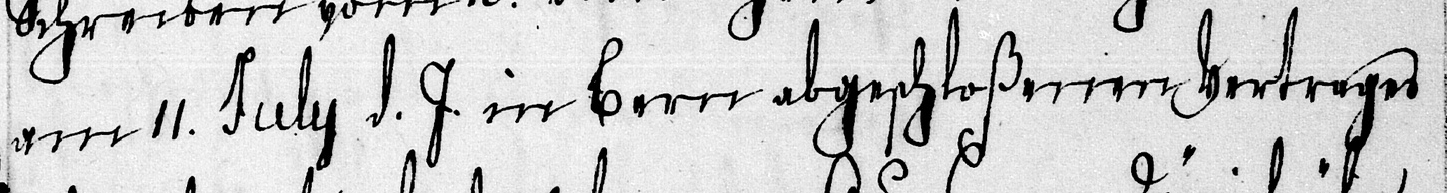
am 11. July d. J. in Bern abgeschloßenen Vertrages
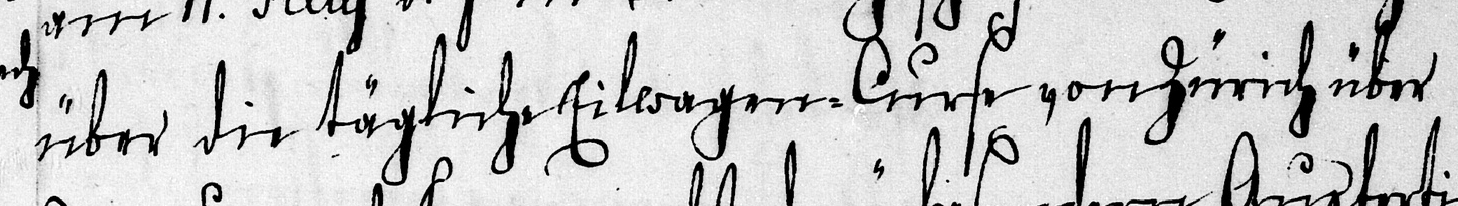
über die tägliche Eilwagen-Curse von Zürich über
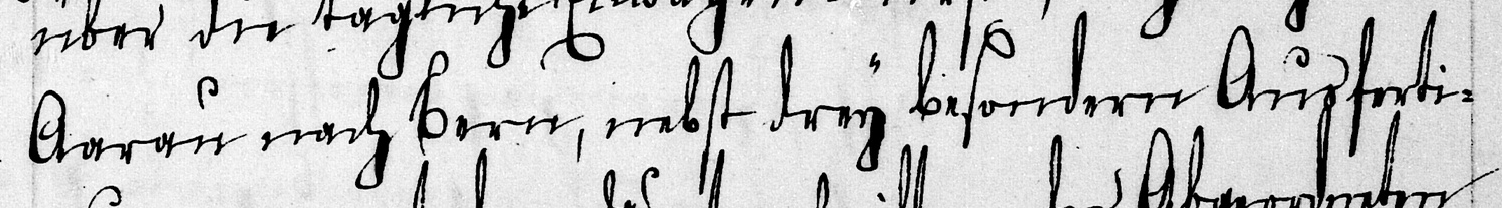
Aarau nach Bern, nebst drey besondern Ausferti¬
